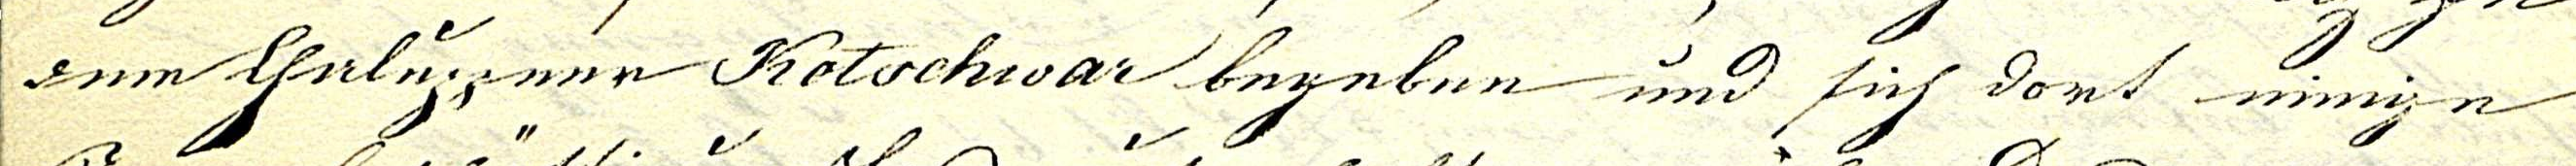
dem Chaluppner Kotschwar begeben und sich dort einige
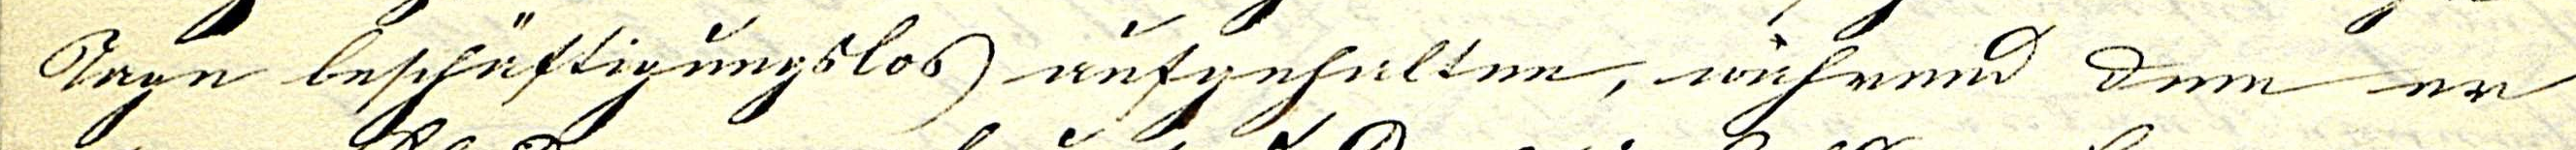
Tage beschäftigungslos aufgehalten, während dem er
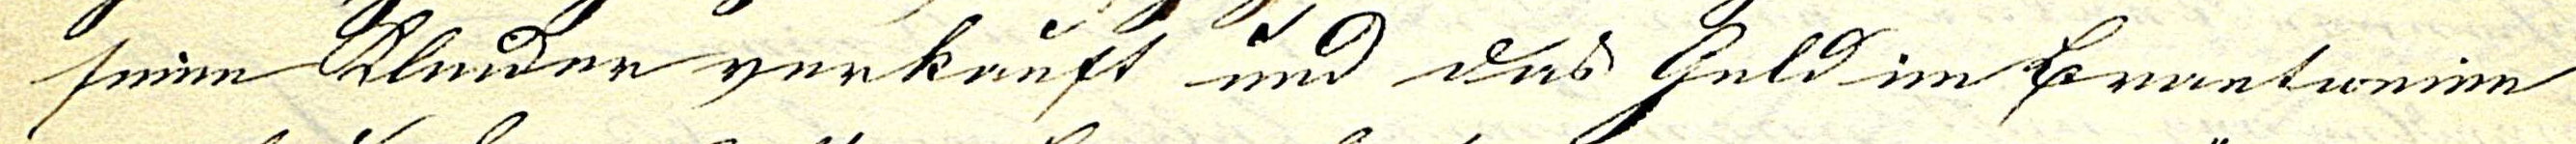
seine Kleider verkauft und das Geld in Brantweine
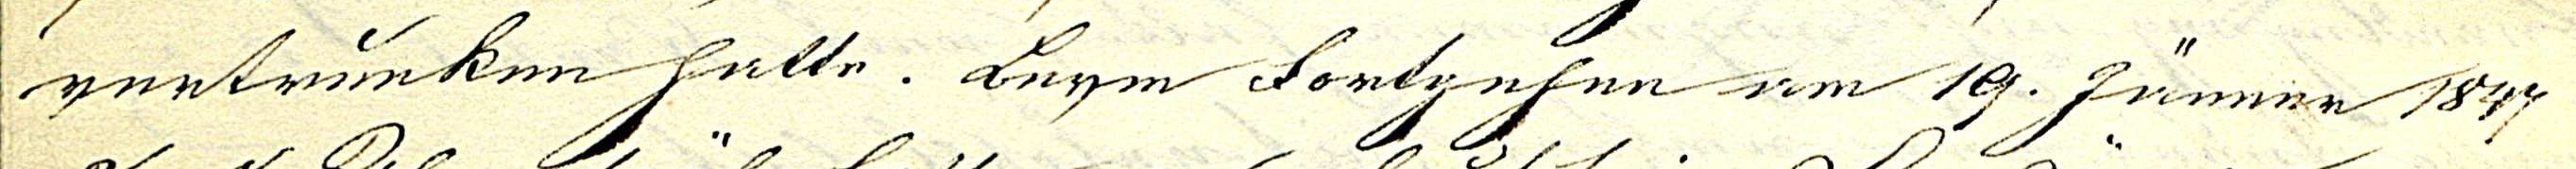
vertrunken hatte. Beym Fortgehen am 19. Jänner 1847
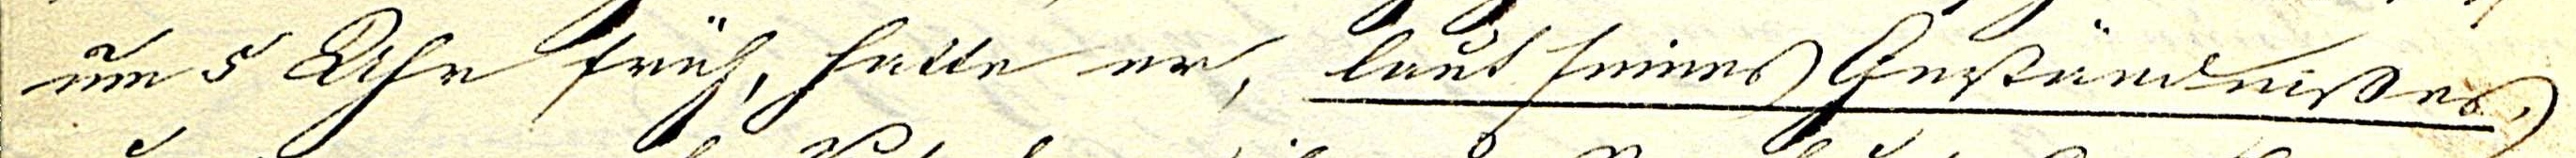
um 5 Uhr früh, hatte er, laut seines Geständnißes,
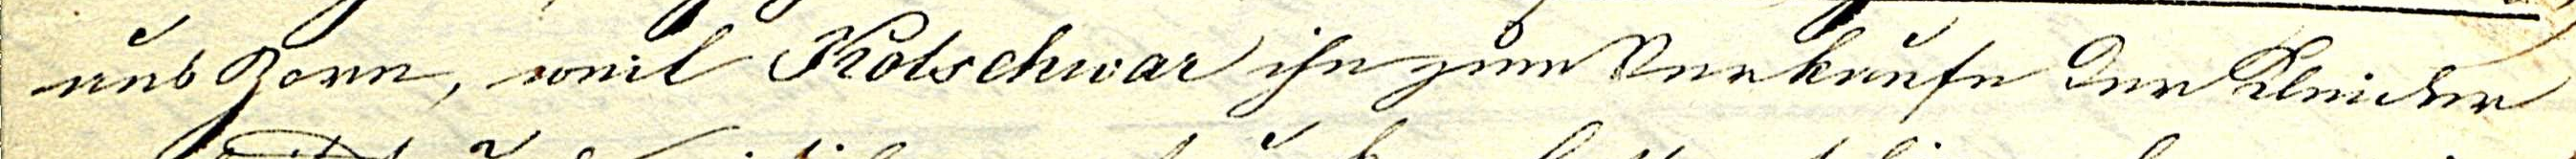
aus Zorn, weil Kotschwar ihn zum Verkaufe der Kleider
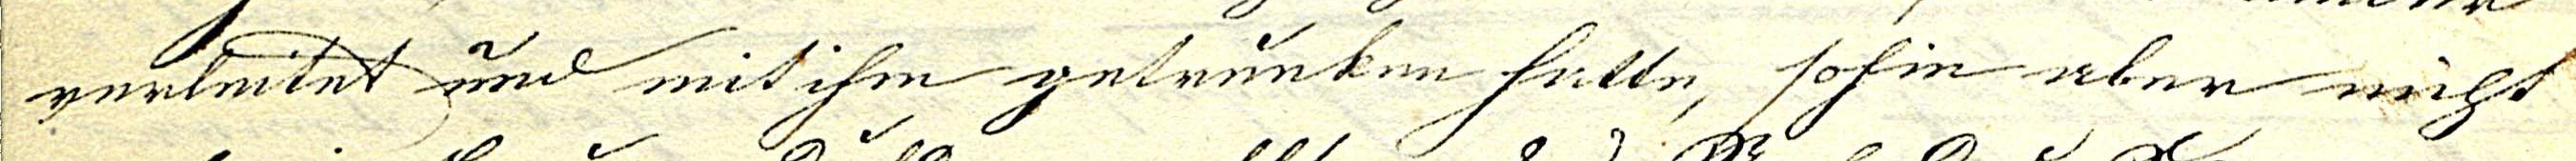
verleitet und mit ihm getrunken hatte, sohin aber nicht
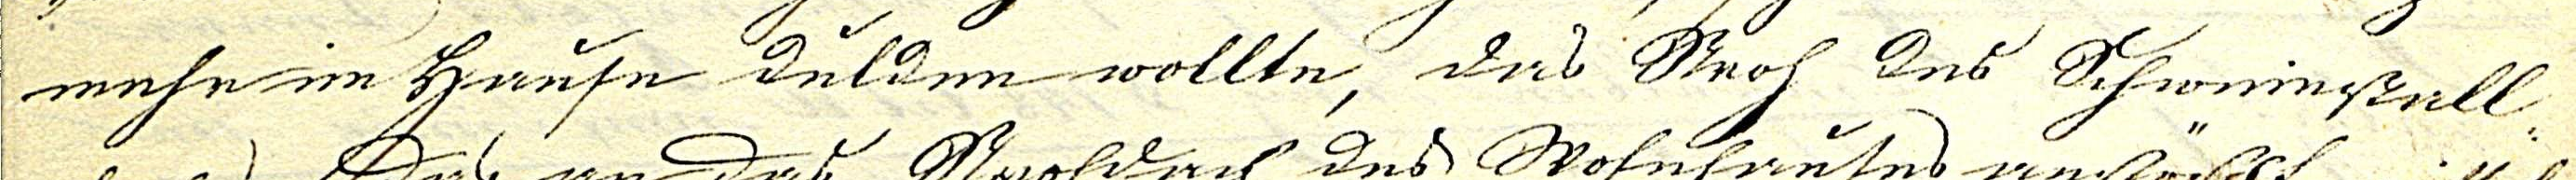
mehr im Hause dulden wollte, das Stroh des Schweinstall¬
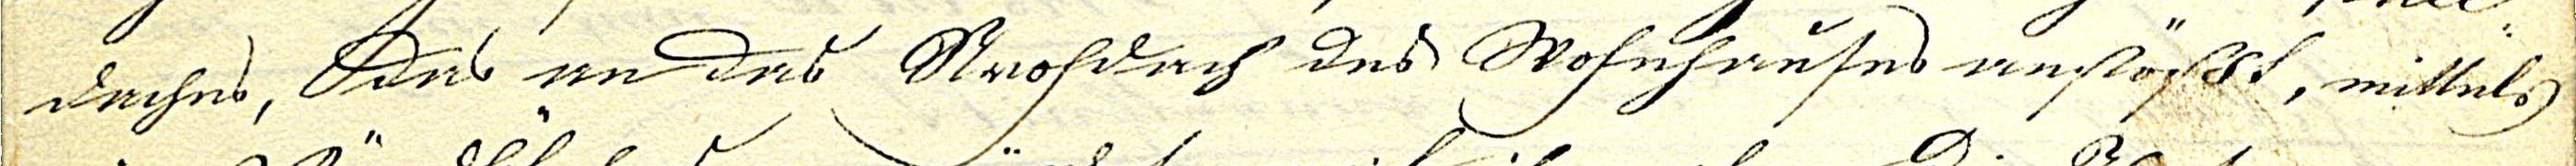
daches, das an das Strohdach des Wohnhauses anstößt, mittels
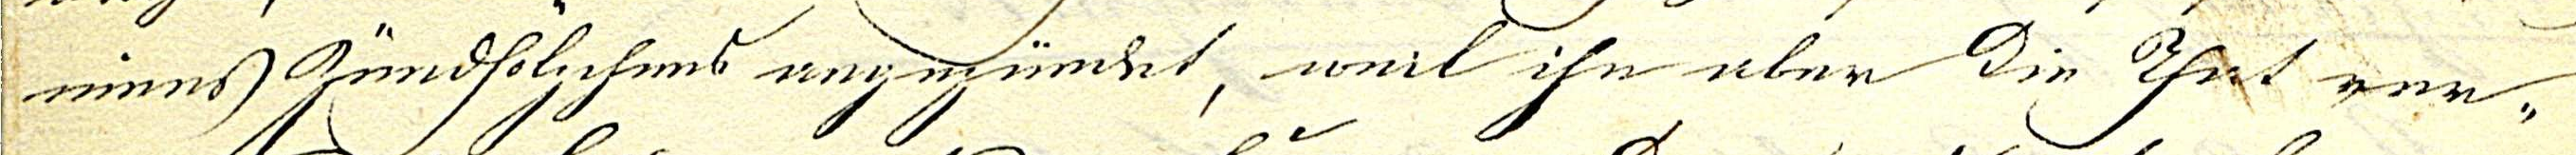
eines Zündhölzchens angezündet, weil ihn aber die That ver¬
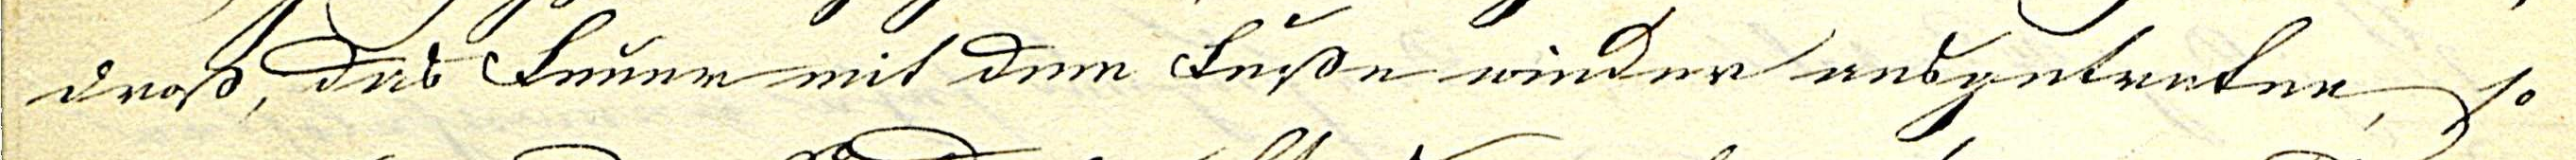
droß, das Feuer mit dem Fuße wieder ausgetreten, so
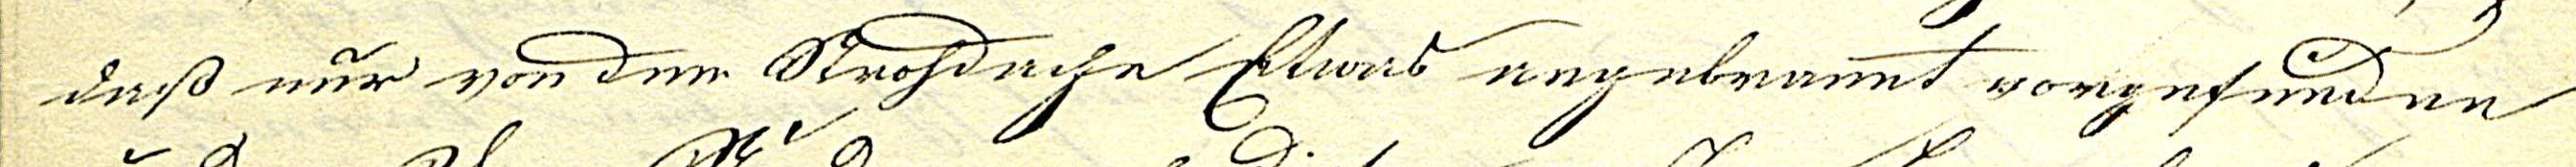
daß nur von den Strohdache Etwas angebrannt vorgefunden
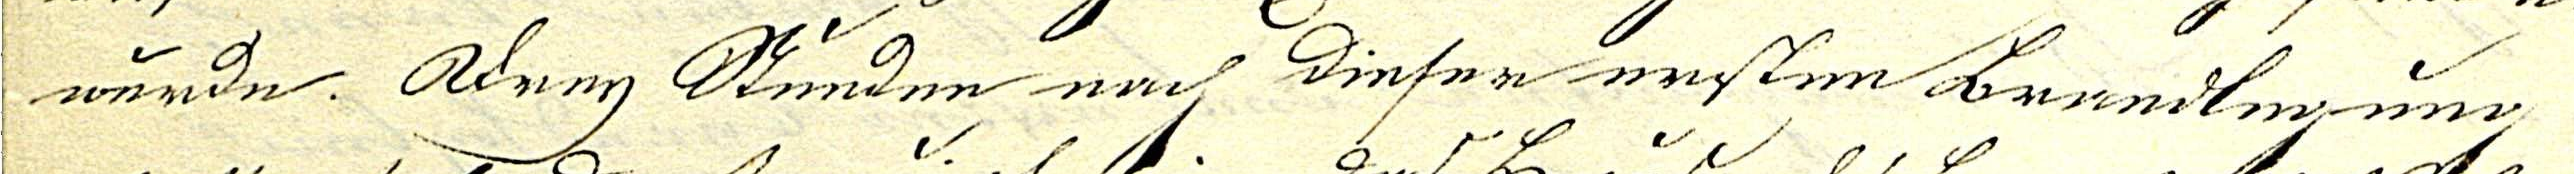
wurde. Drey Stunden nach dieser ersten Brandlegung
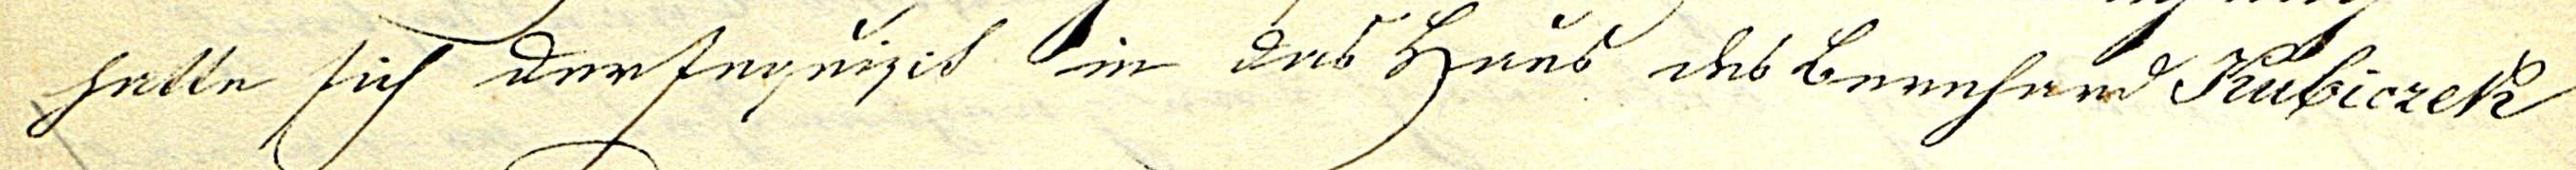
hatte sich der Inquisit in das Haus des Bernhard Kubiczek
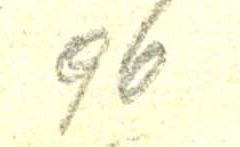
96
